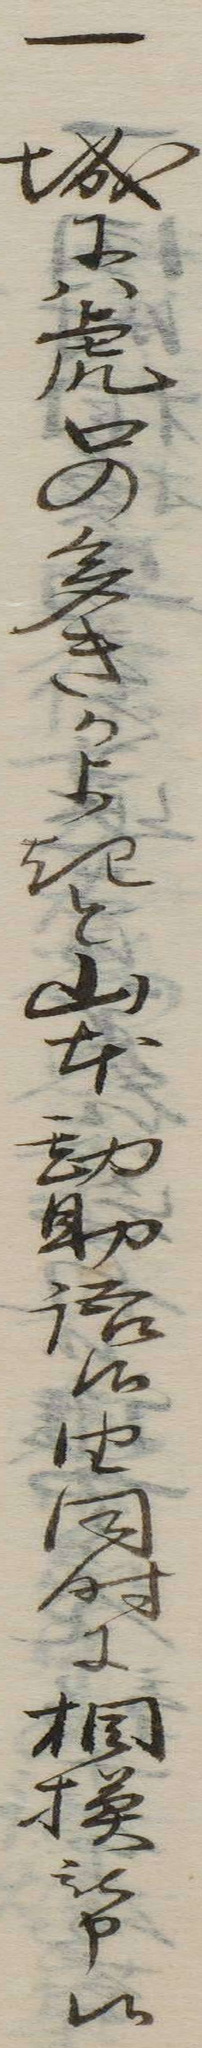一城には虎口の多きかよきと山本勘助語候由同時に相模被申候
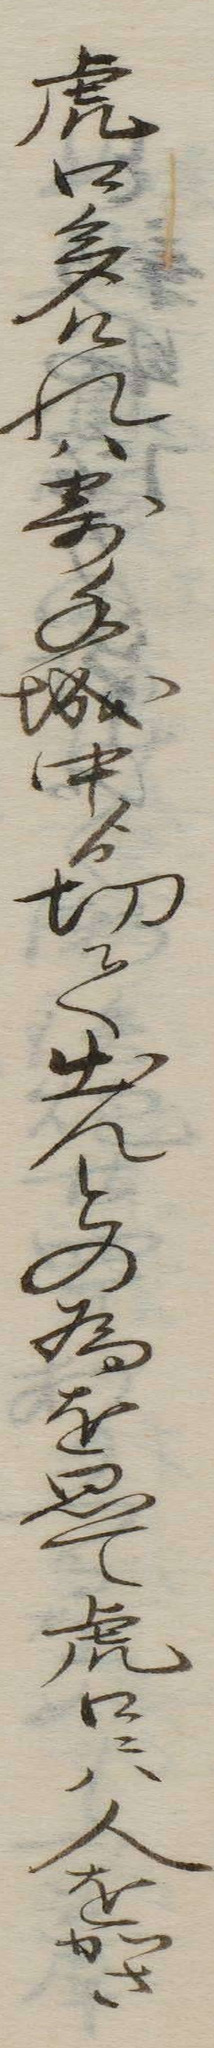虎口多けれは寄手城中より切て出んとの為を思て虎口には人をかさ
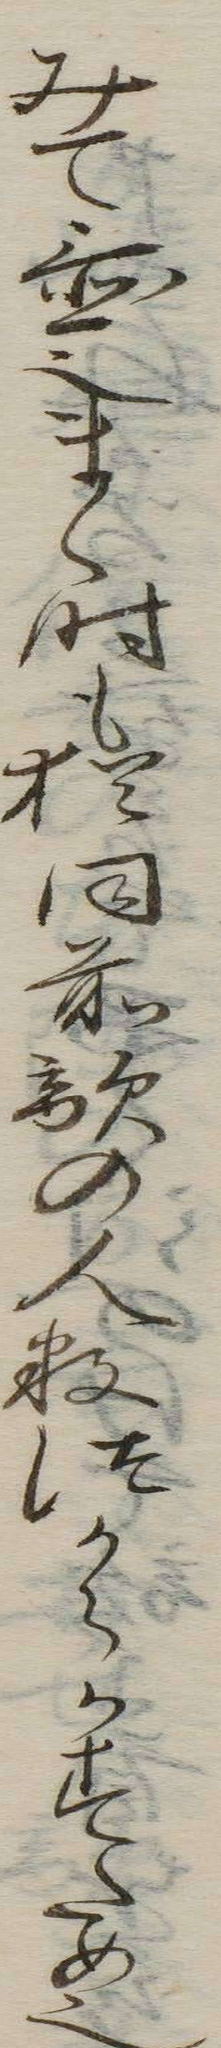みて置也まゝ時も猶同前敵の人数つからかすため也
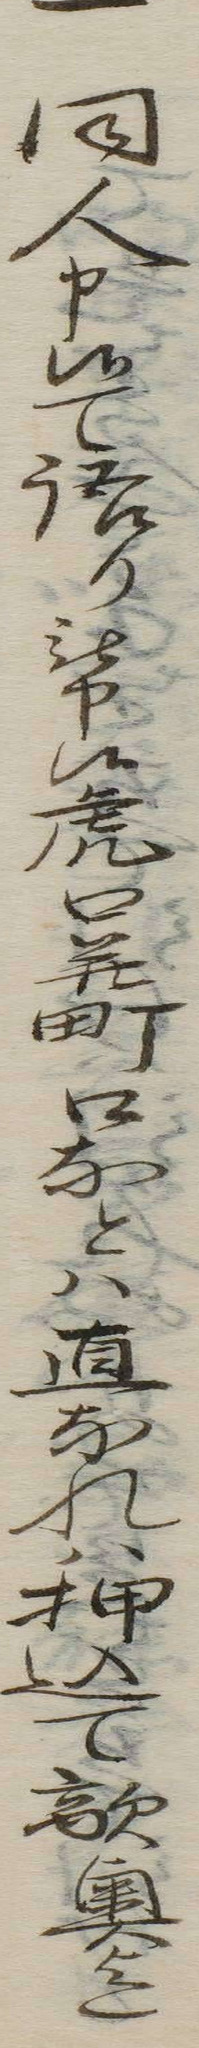一同人申候て語り被申候虎口并町口なとは直なれは押込て敵奥迄
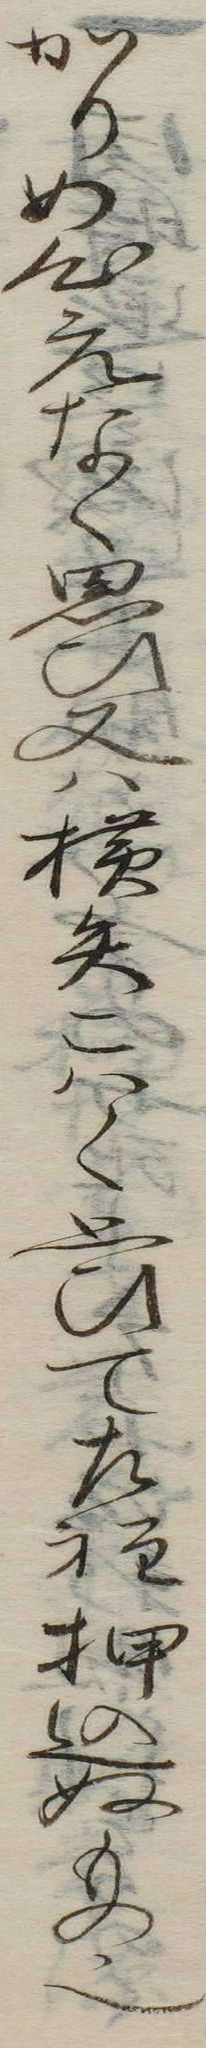かりめ心えなく思ひ又は横矢こはく思ひて左程押込ぬもの也
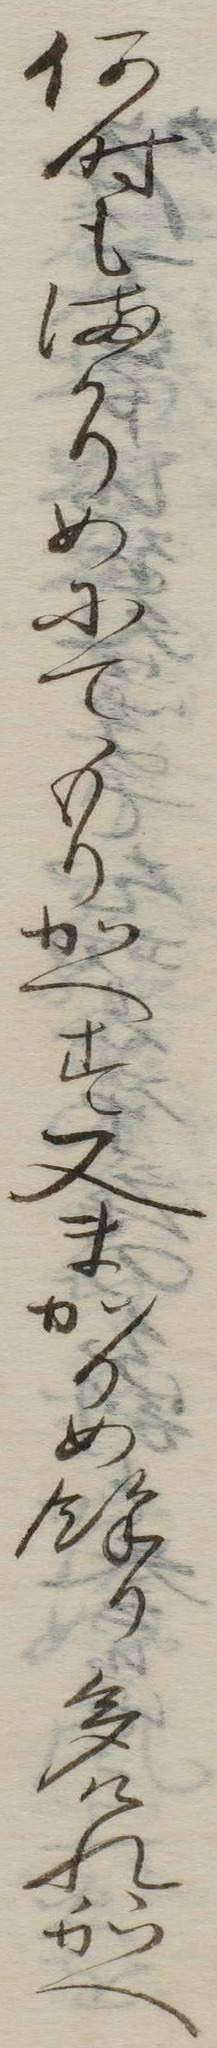何時もまかりめにてもりかへす又まかりめ餘り多けれはかへ
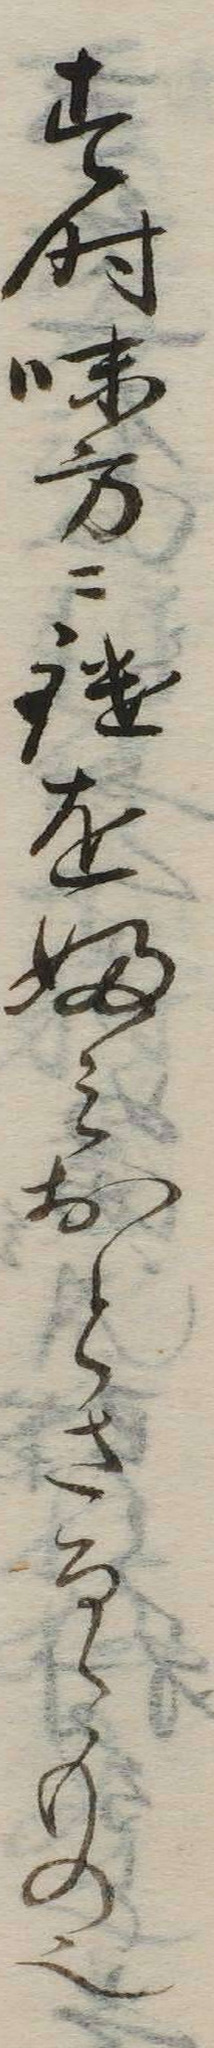す時味方に鑓をふみおとさるゝもの也
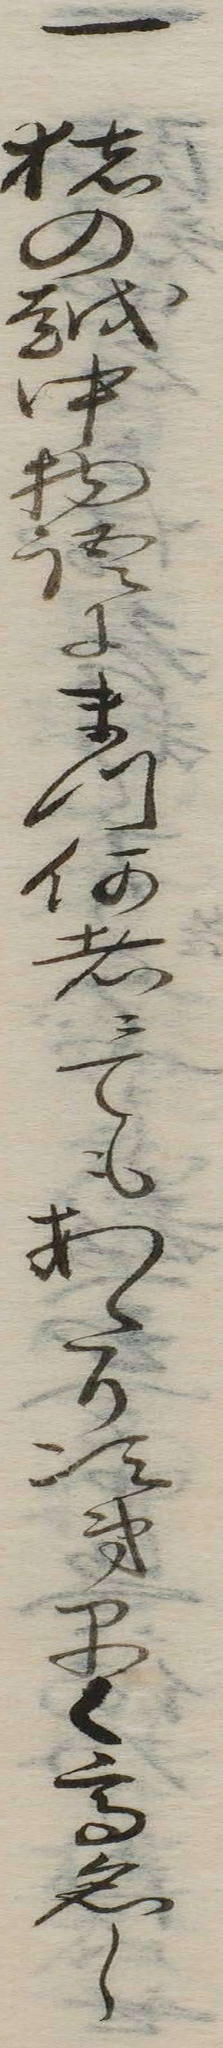一猪の越中物語にまつ何者にてもあたり次第早く高名し
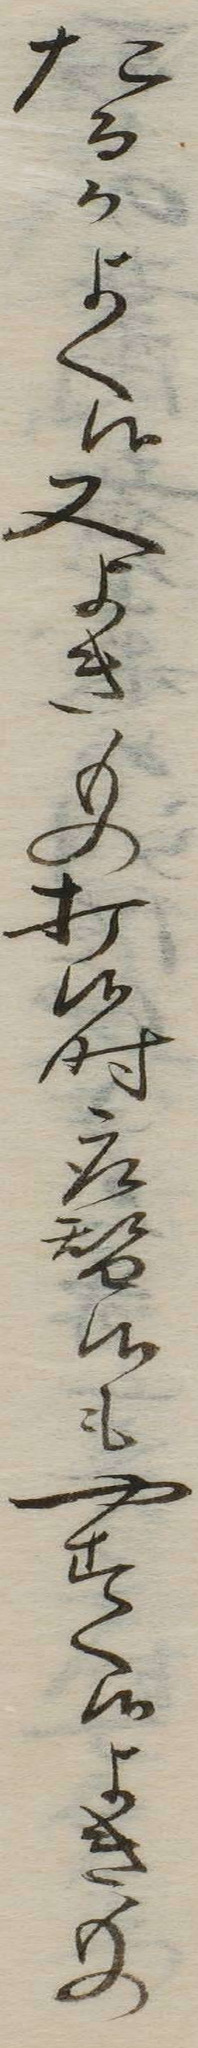たるかよく候又よきもの打候時取替候もやすく候よきもの
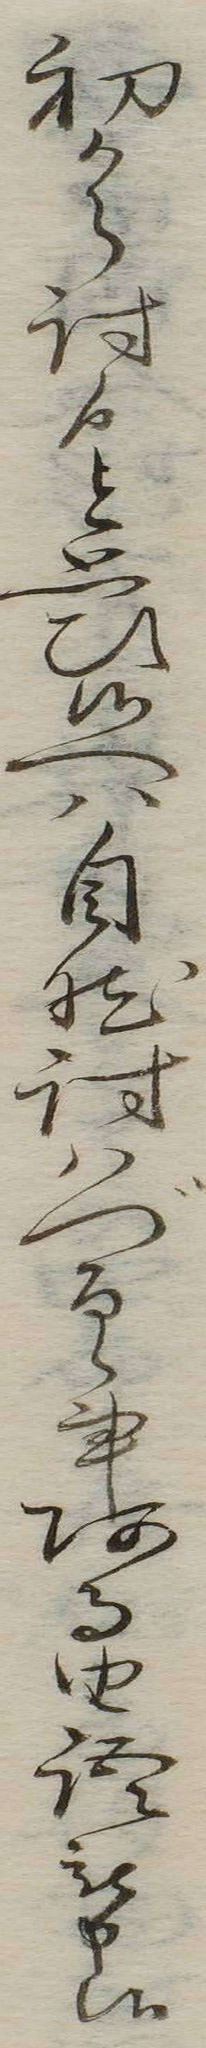初から討候と思ひ候へは自然討はづるゝ事ある由語被申候
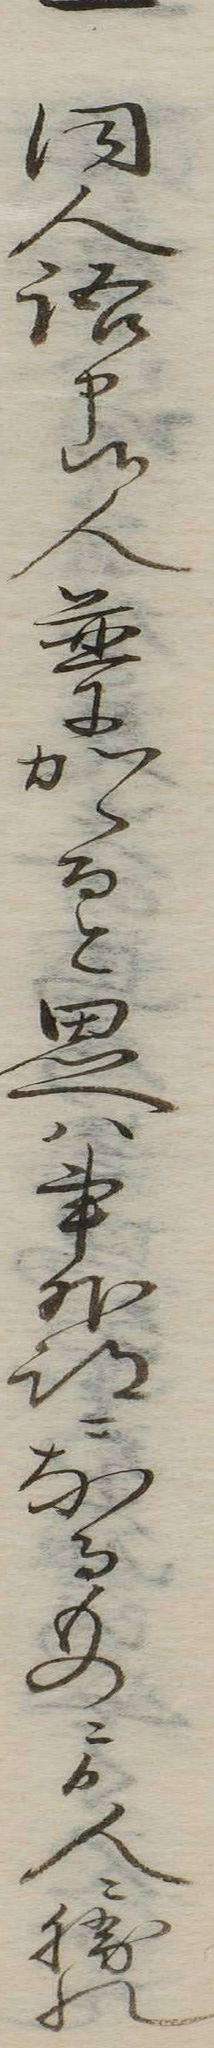一同人語申候人並にかゝると思へは事外跡になるものに候人に勝れ
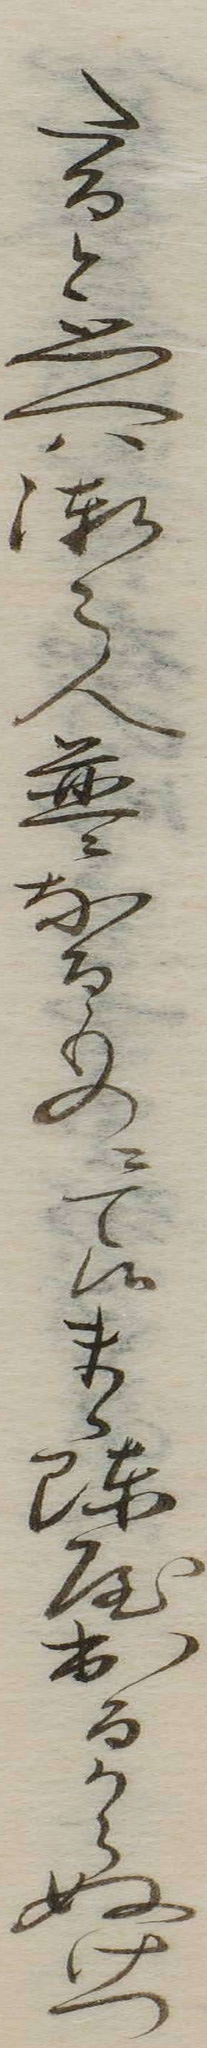たると思へは漸々人並になるものにて候まゝ陣屋出るからぬけつ
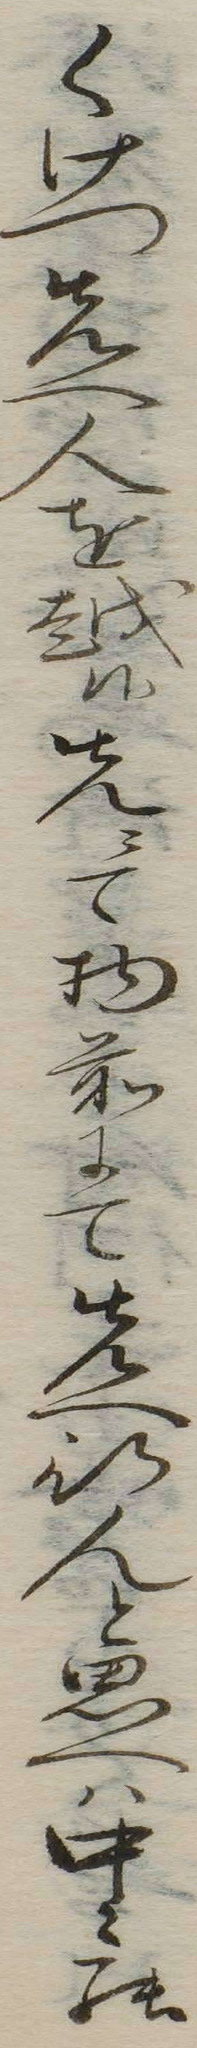くけつ先へ人を越候先にて物前にて先へ行んと思へは中々能
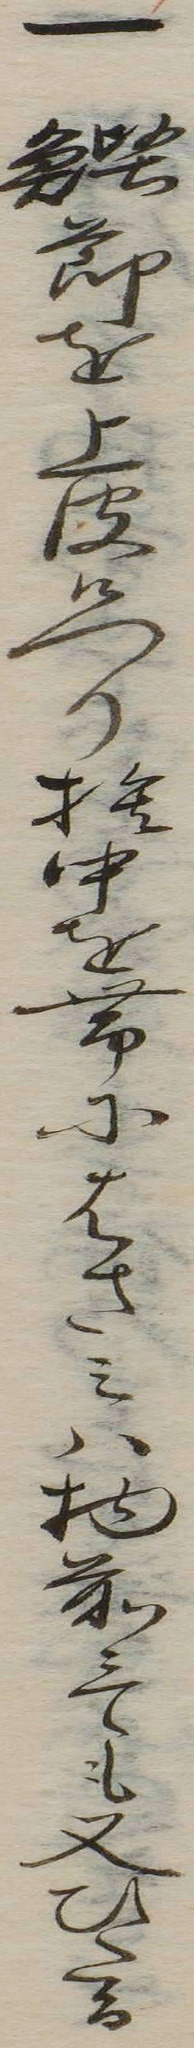一鰹節を上皮けつり捨中を帯にはさみは物前にても又ひたる
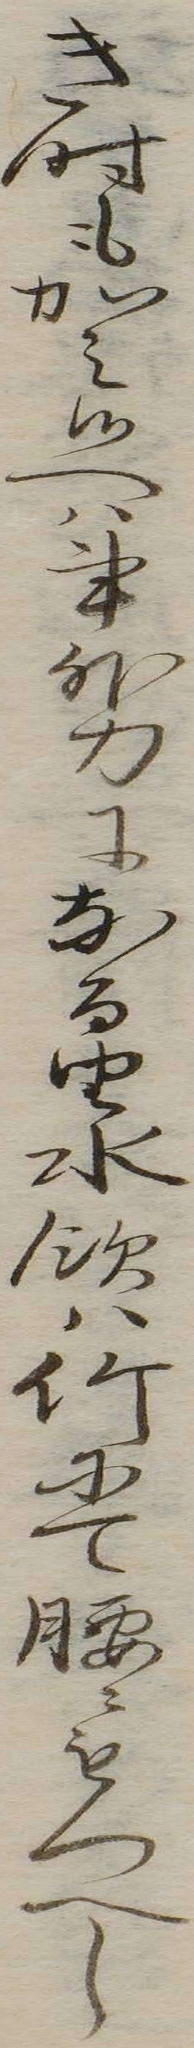き時もかみ候へは事外力になる由水飲は竹にて腰にもつへし
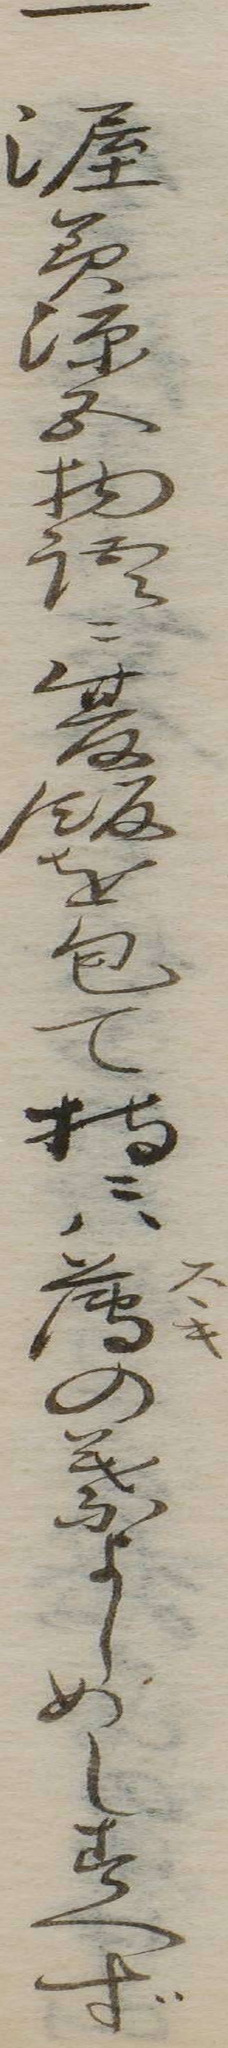一握美源五物語に隻飯を包て持には薄の葉よしめしすへず
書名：三河之物語
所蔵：国文学研究資料館
